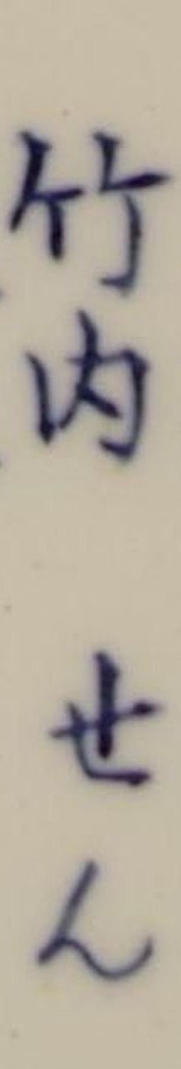竹内せん
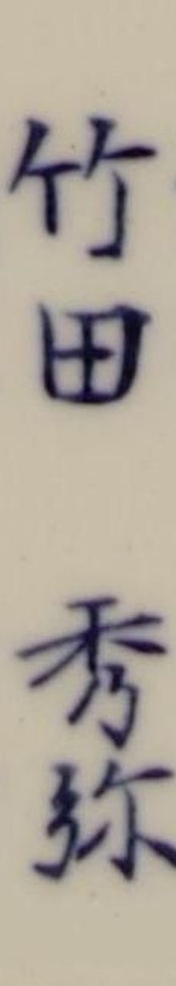竹田秀弥
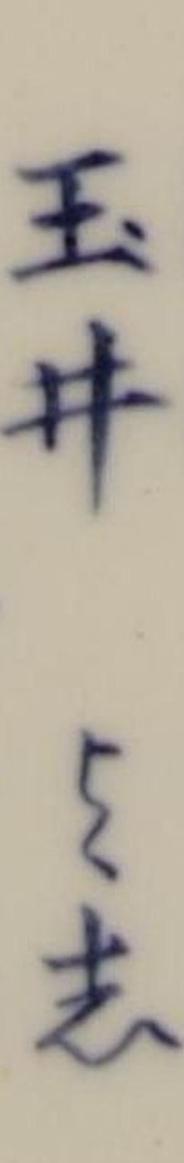玉井よし
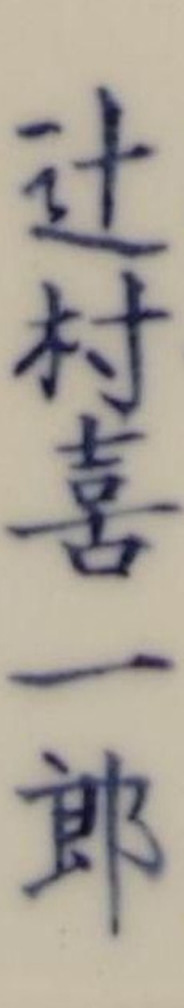辻村喜一郎
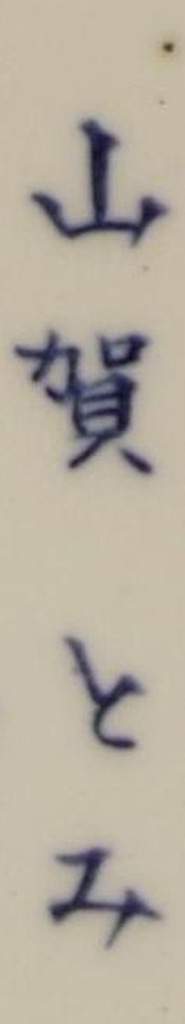山賀とみ
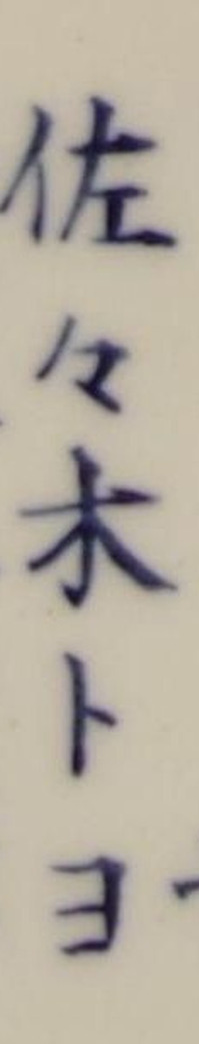佐々木トヨ
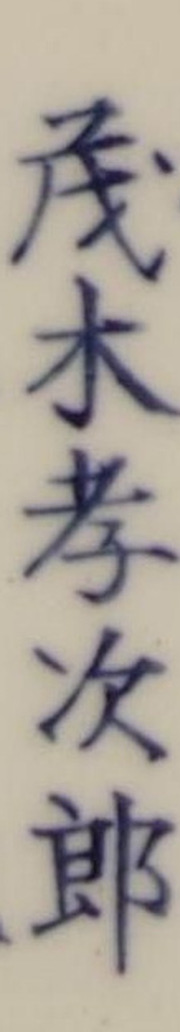茂木孝次郎
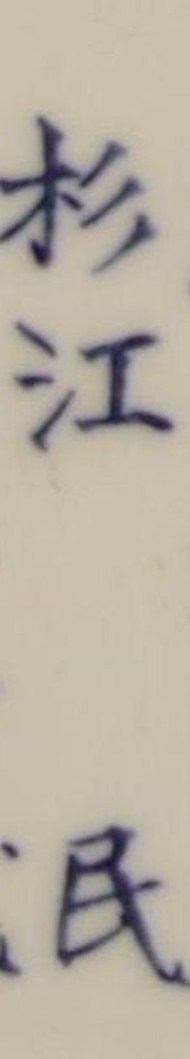杉江民

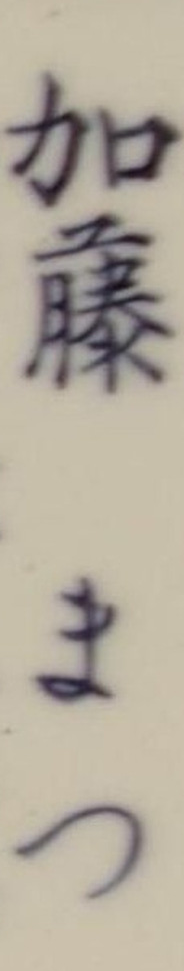加藤まつ
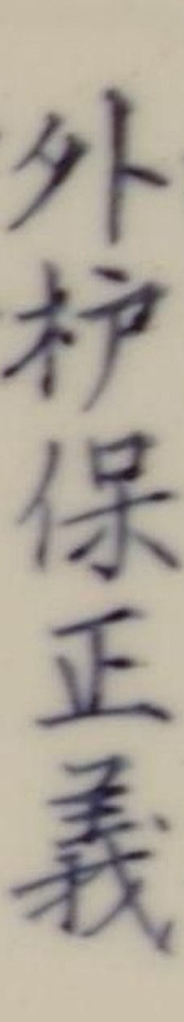外枦保正義
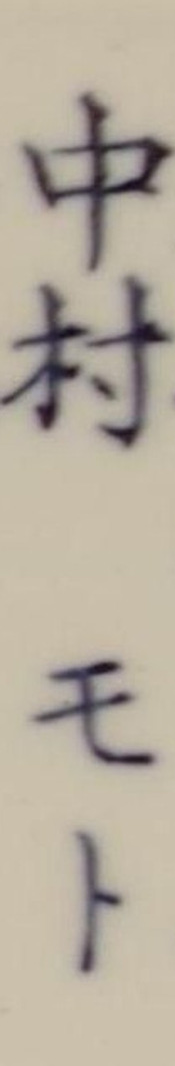中村モト
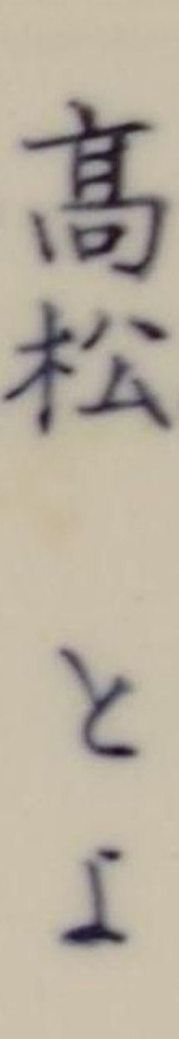高松とよ
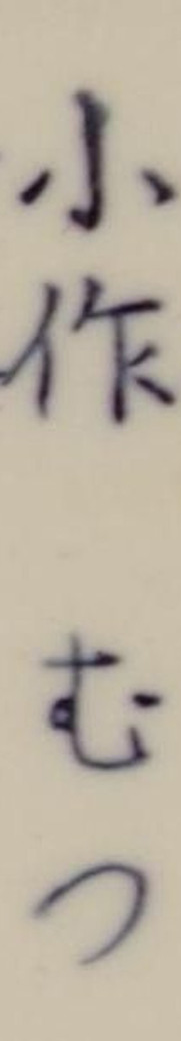小作むつ
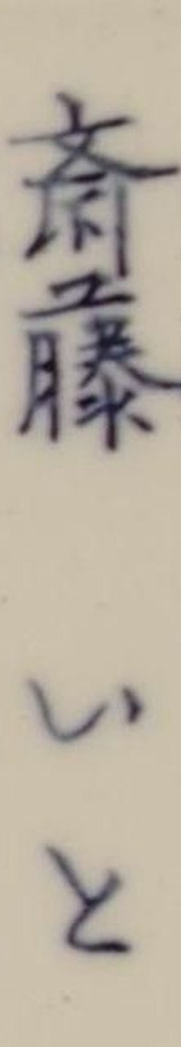斎藤いと
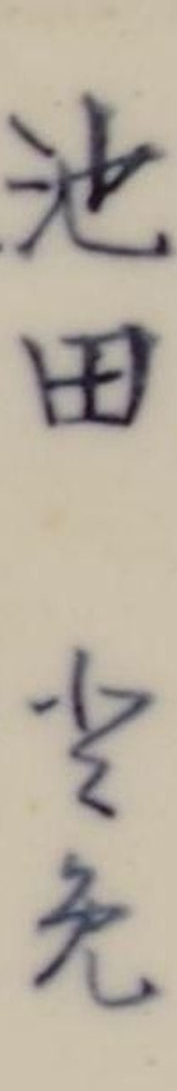池田とめ
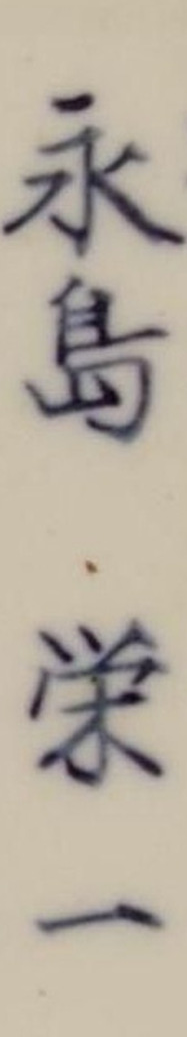永島栄一
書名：E~L
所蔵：高野山金剛峯寺
